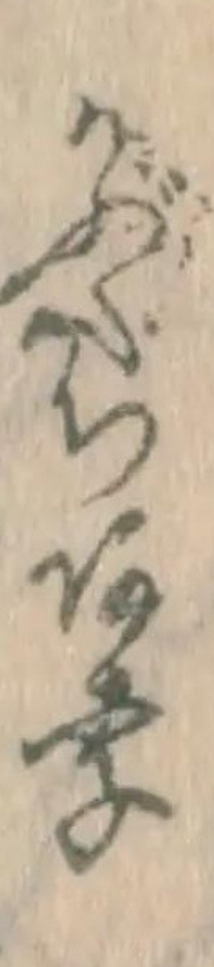かぶたちあき
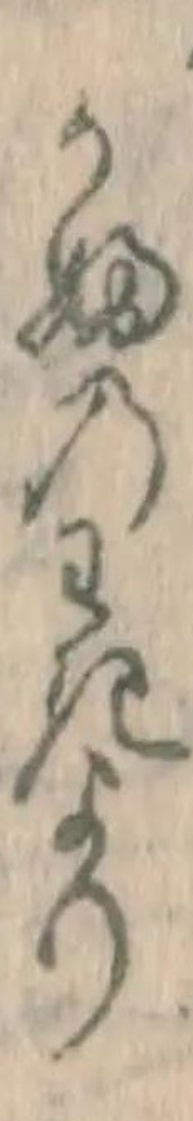かふのわきより
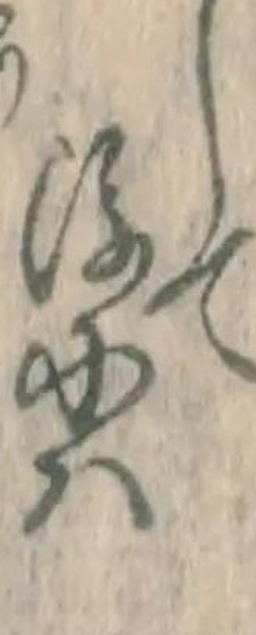後には
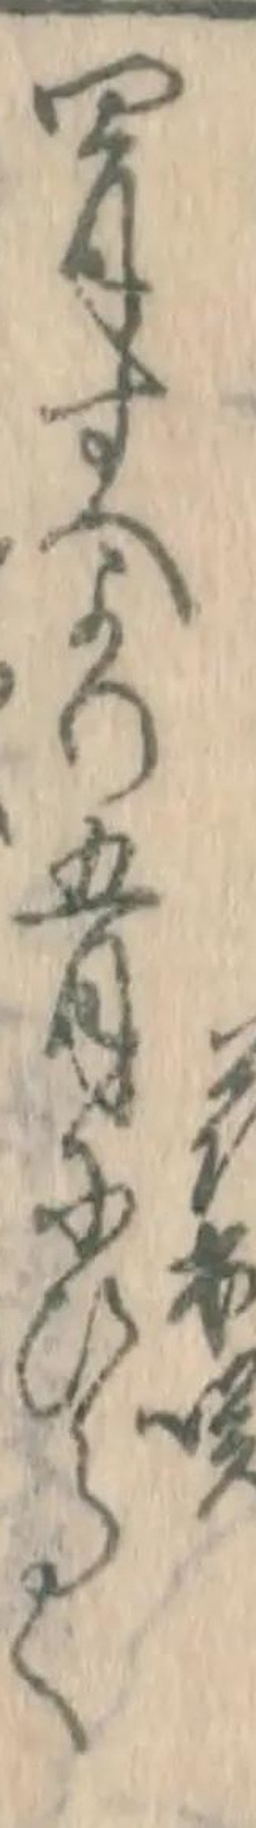四月すへより五月にひらく
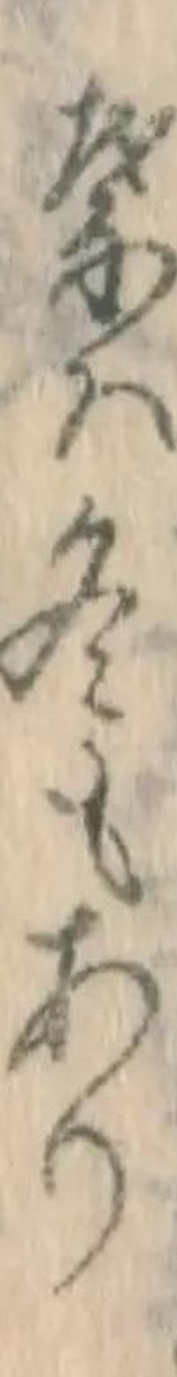葉は冬もあり
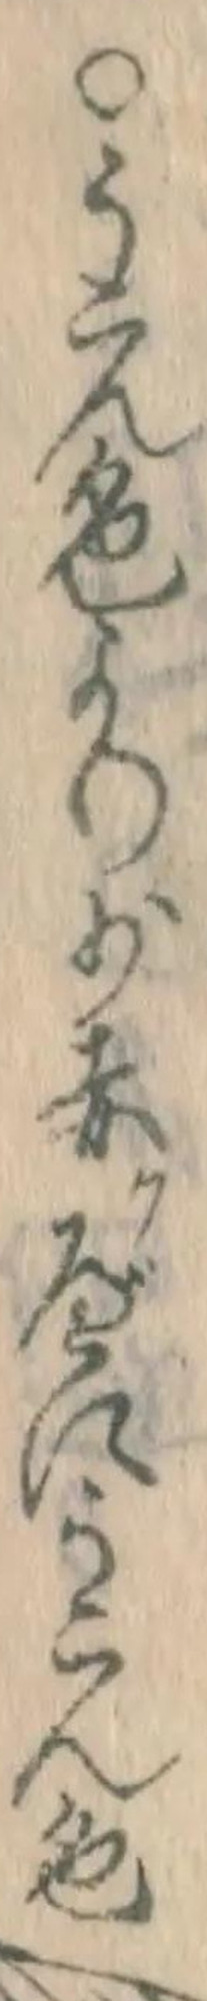〇うこん色より少赤くべにうこん色
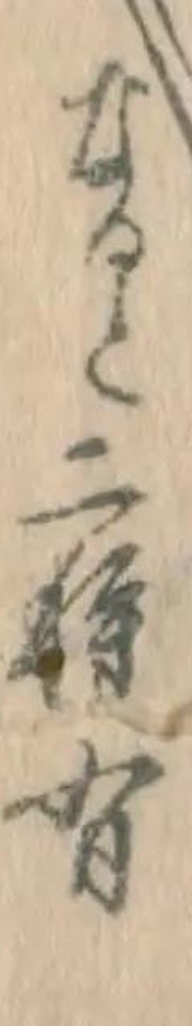なると二種有

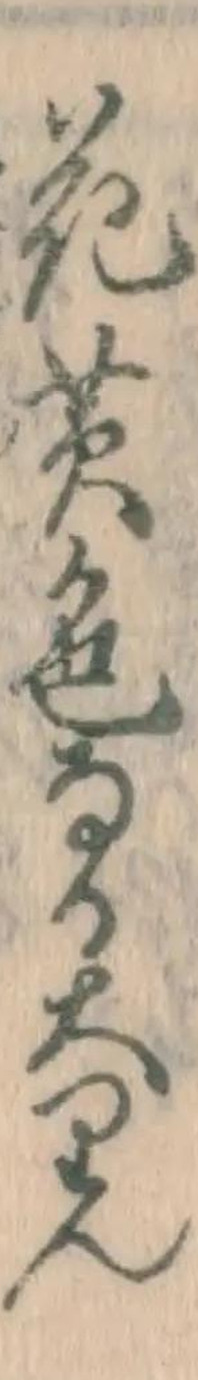花黄色なり大りん
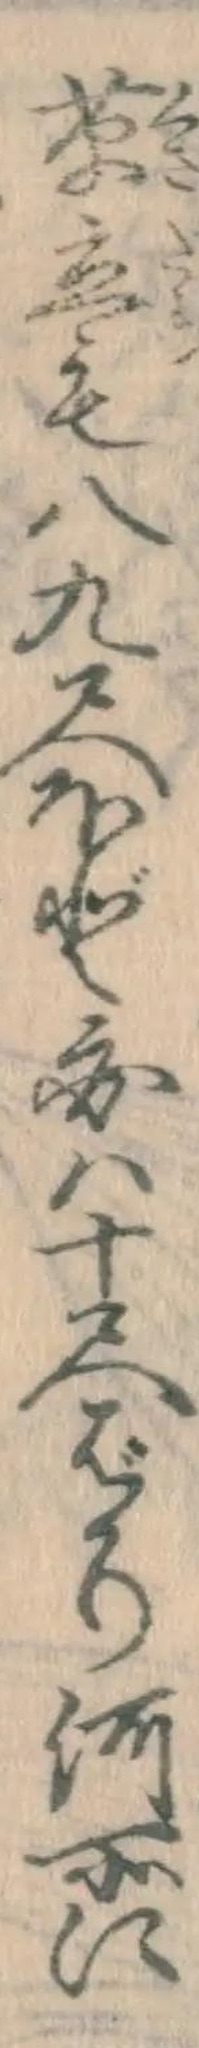草立も八九尺ほど亦は十尺ばかり何
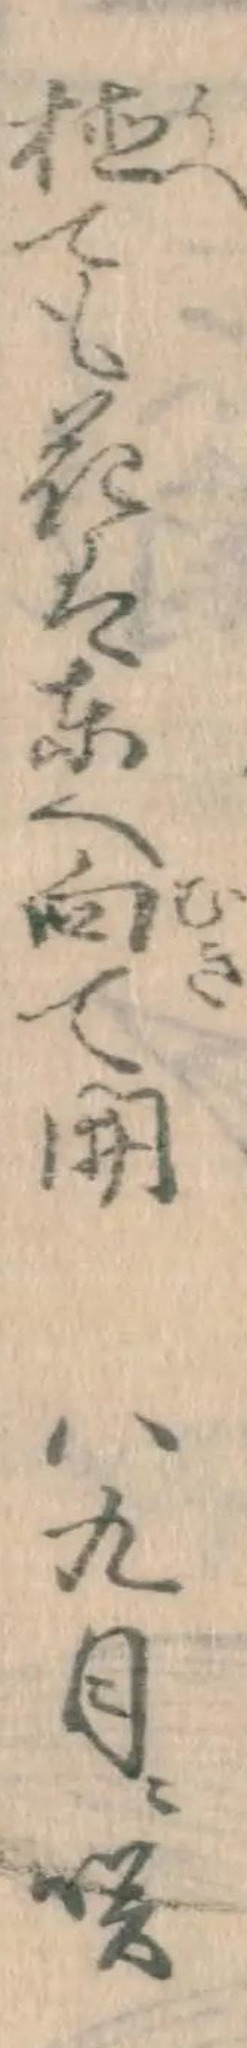植ても花は東へ向て開八九月に咲
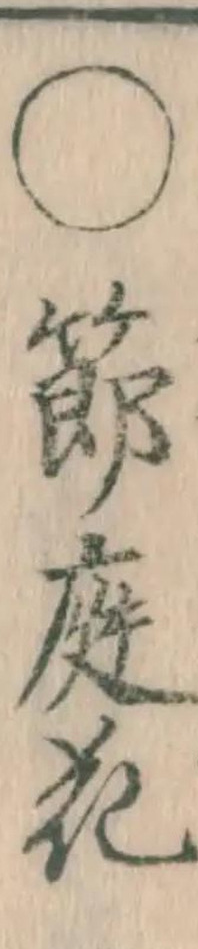〇節庭花
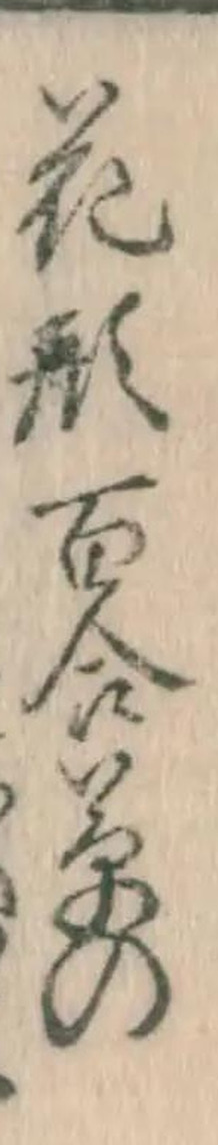花形百合草の
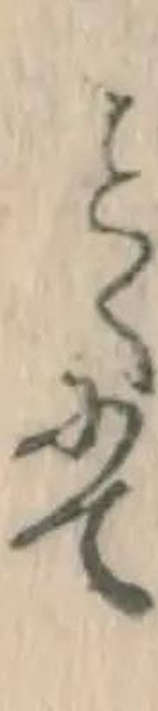ことくにて
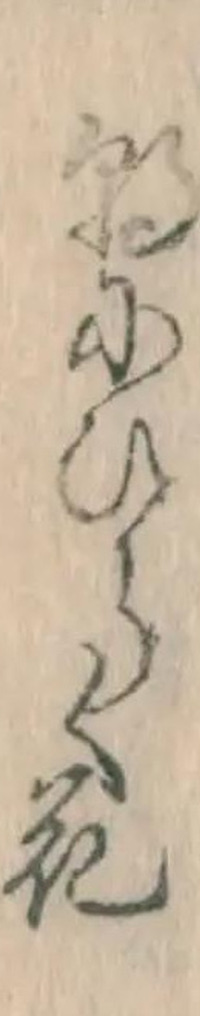朝にひらく花
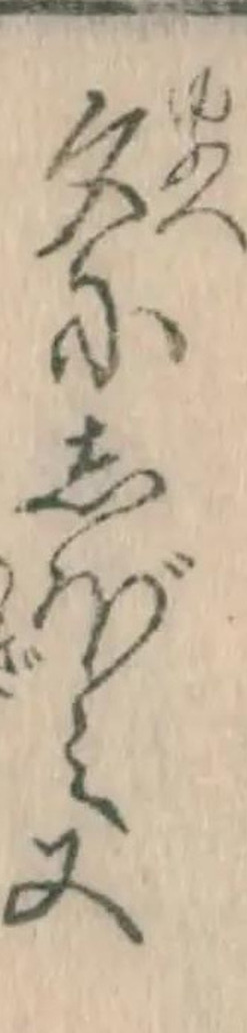夕しぼみ又
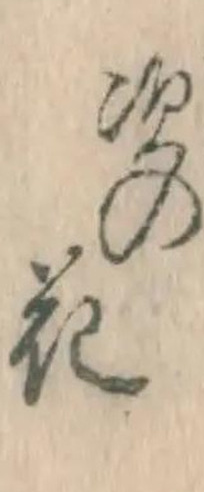次の花
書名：艸花繪前集. [1]
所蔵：国立国会図書館 National Diet Library, JAPAN
